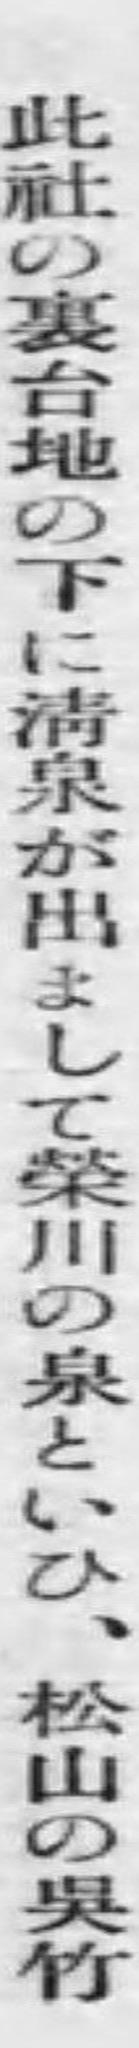此社の裏台地の下に清泉が出まして栄川の泉といひ、松山の呉竹
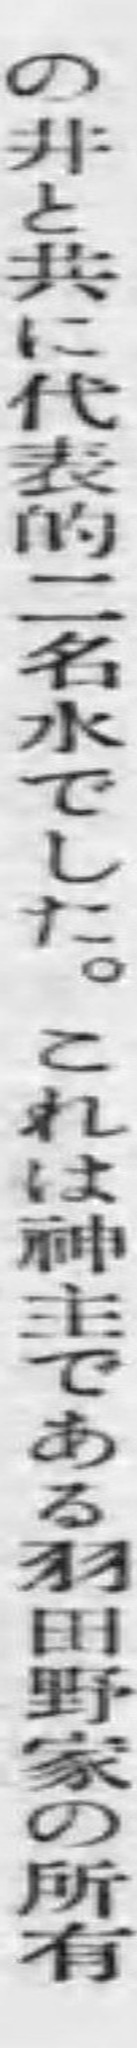の井と共に代表的二名水でした。これは神主である羽田野家の所有
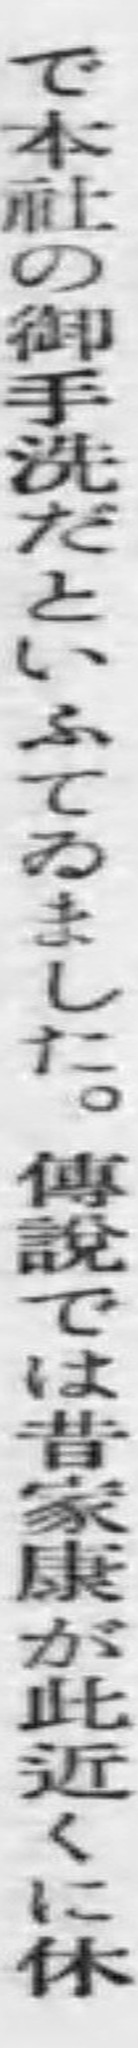で本社の御手洗だといふてゐました。伝説では昔家康が此近くに休
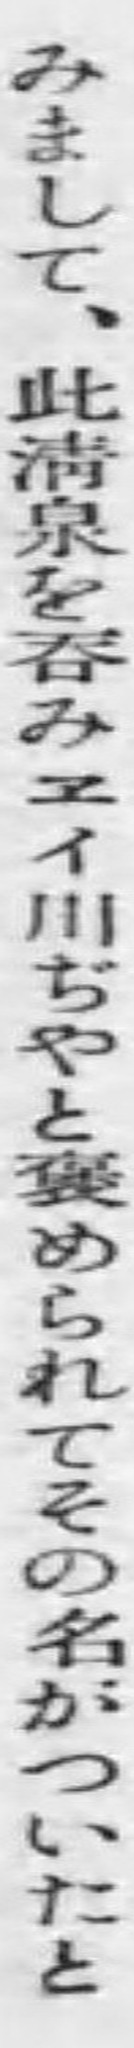みまして、此清泉を呑みヱイ川ぢやと褒められてその名がついたと
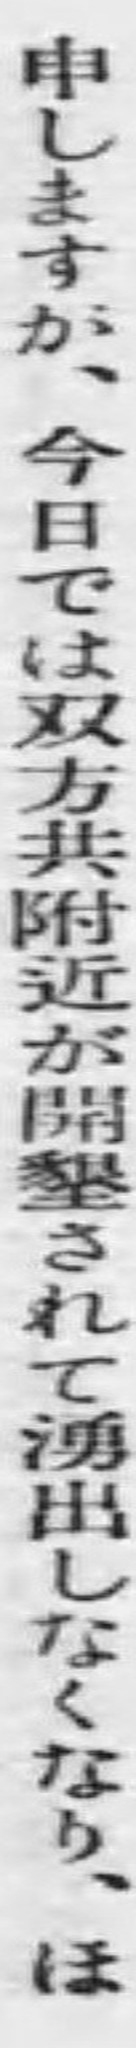申しますが、今日では双方共附近が開墾されて湧出しなくなり、ほ
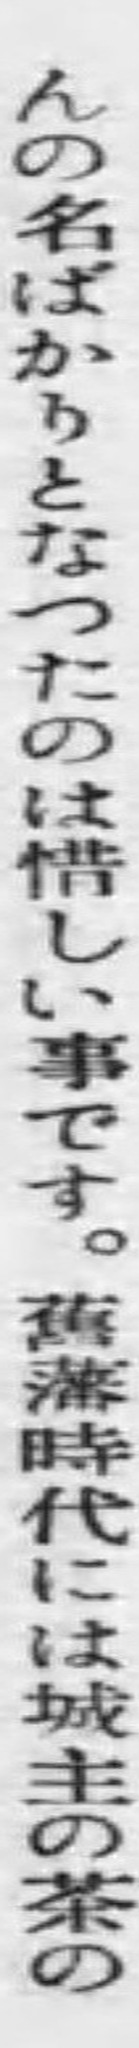んの名ばかりとなつたのは惜しい事です。旧藩時代には城主の茶の
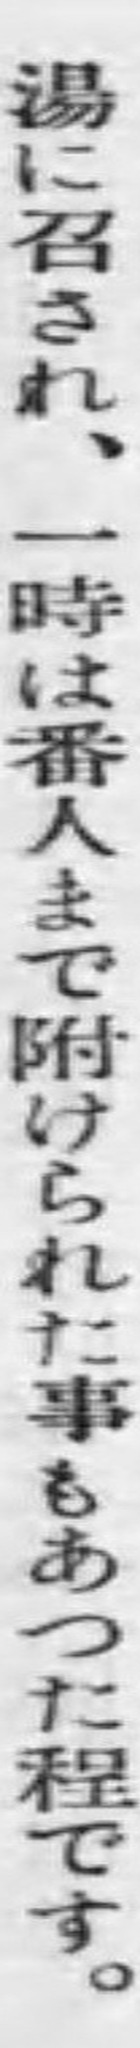湯に召され、一時は番人まで附けられた事もあつた程です。
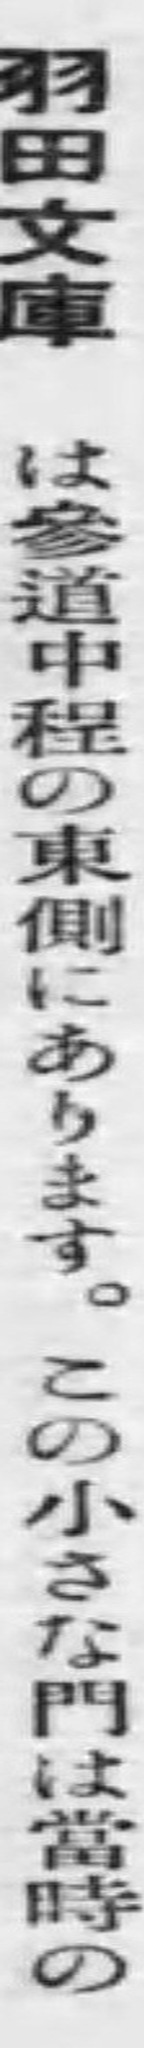羽田文庫は参道中程の東側にあります。この小さな門は当時の
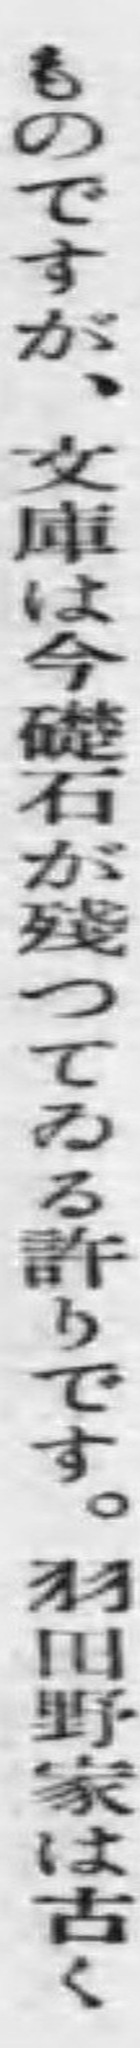ものですが、文庫は今礎石が残つてゐる許りです。羽田野家は古く
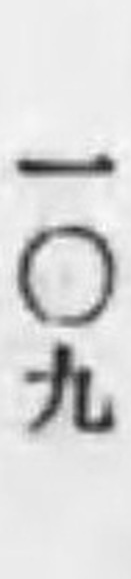一〇九

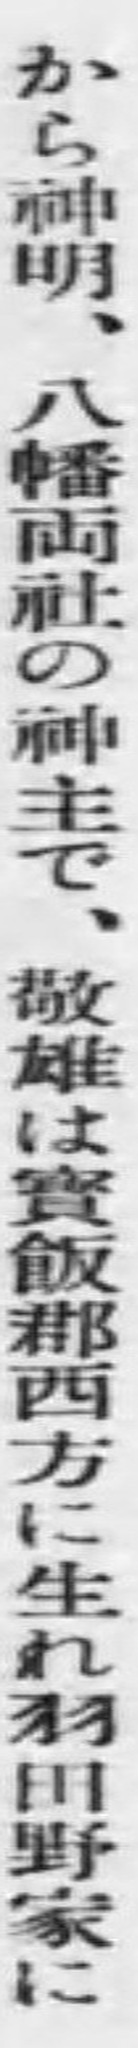から神明、八幡両社の神主で、敬雄は宝飯郡西方に生れ羽田野家に
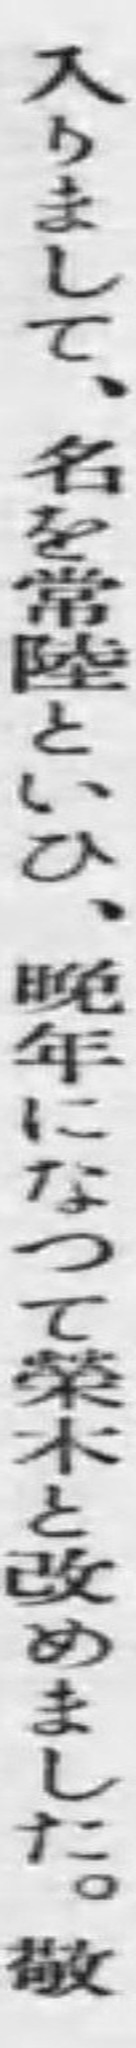入りまして、名を常陸といひ、晩年になつて栄木と改めました。敬
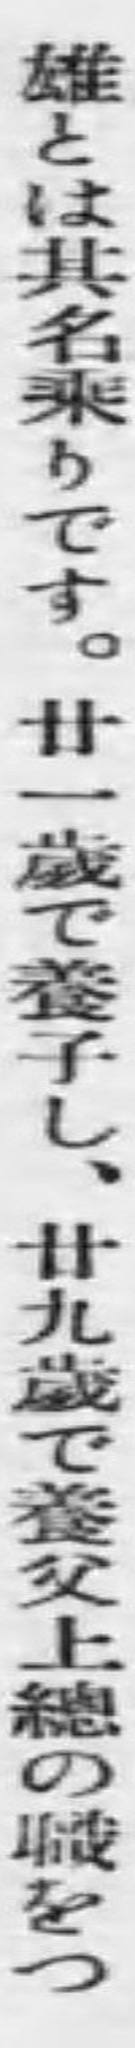雄とは其名乗りです。廿一歳で養子し、廿九歳で養父上総の職をつ
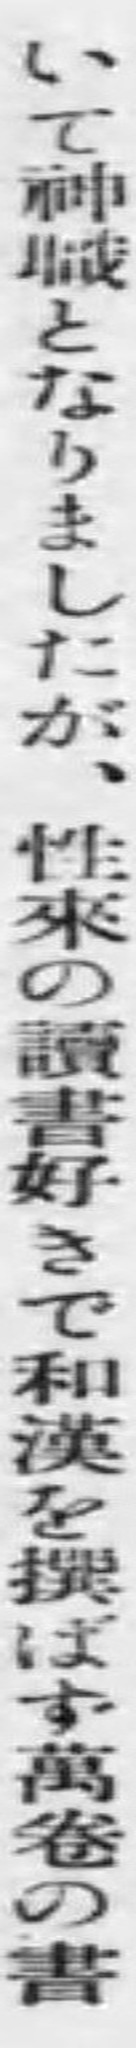いて神職となりましたが、性来の読書好きで和漢を撰ばず万巻の書
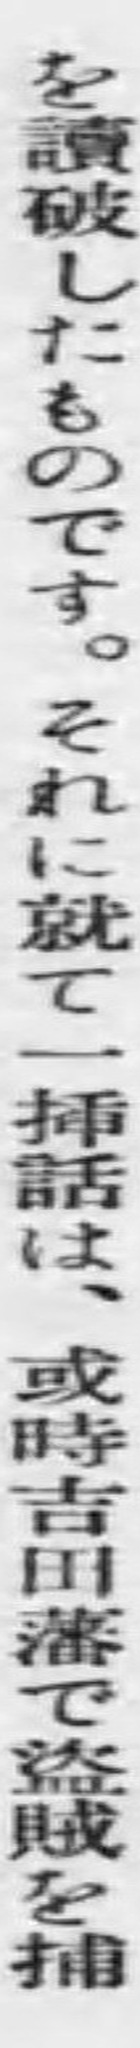を読破したものです。それに就て一挿話は、或時吉田藩で盗賊を捕
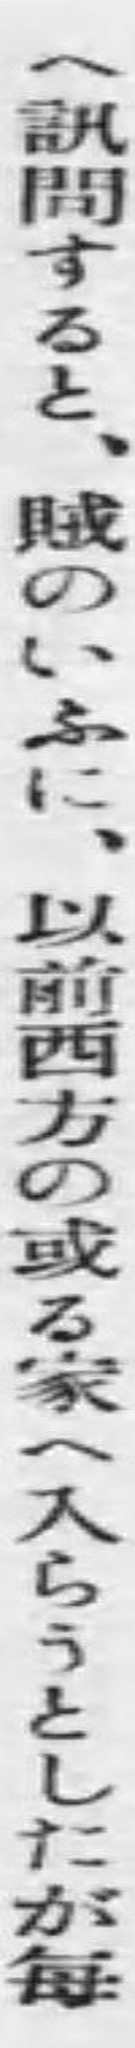へ訊問すると、賊のいふに、以前西方の或る家へ入らうとしたが毎
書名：東三河道中記 : 豊橋市及其附近案内
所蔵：国立国会図書館 National Diet Library, JAPAN
